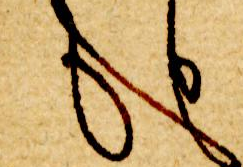To
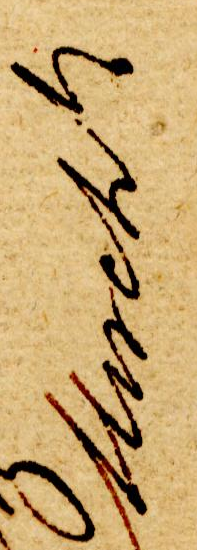Merch^t
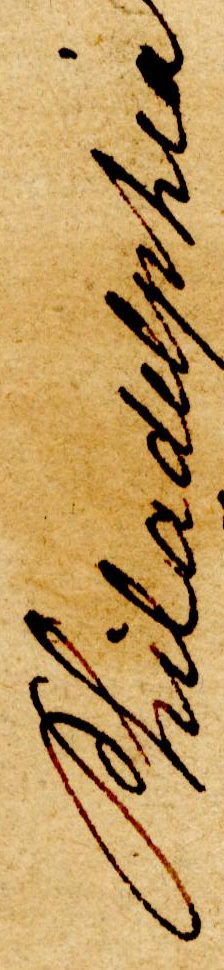Philadelphia
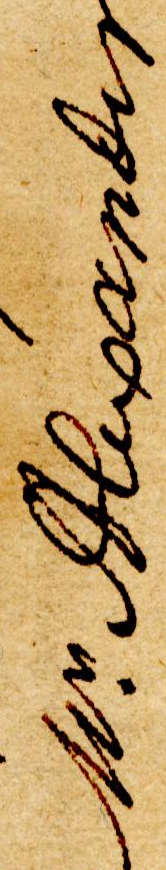M^r Alexander
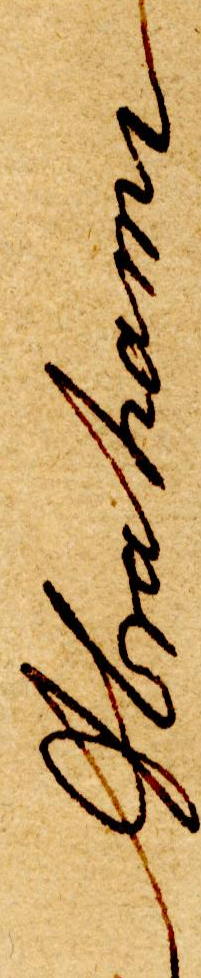Abraham
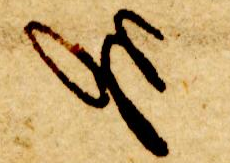In
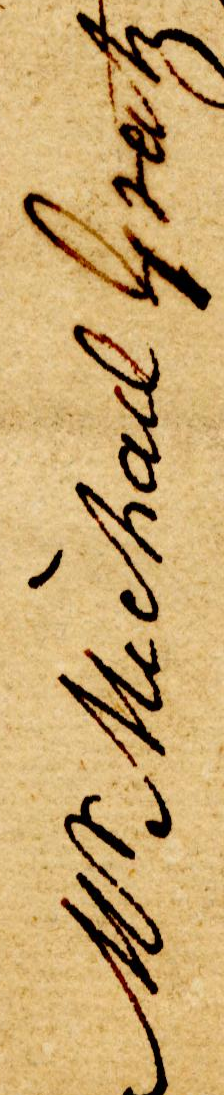M^r Michael Gratz
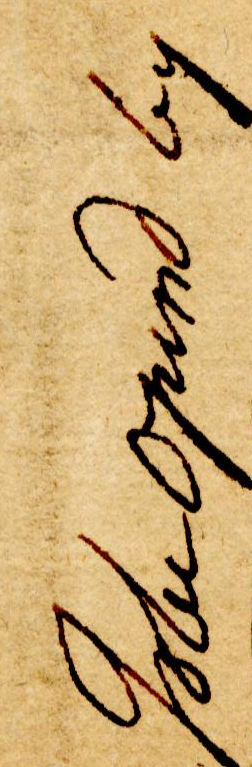To be opend by
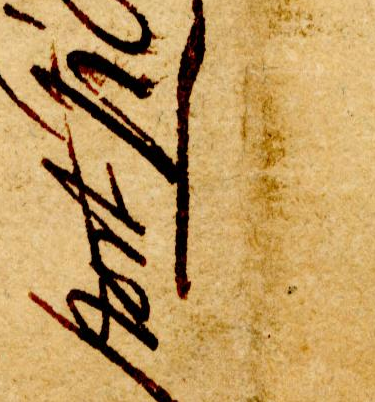Post P'd
